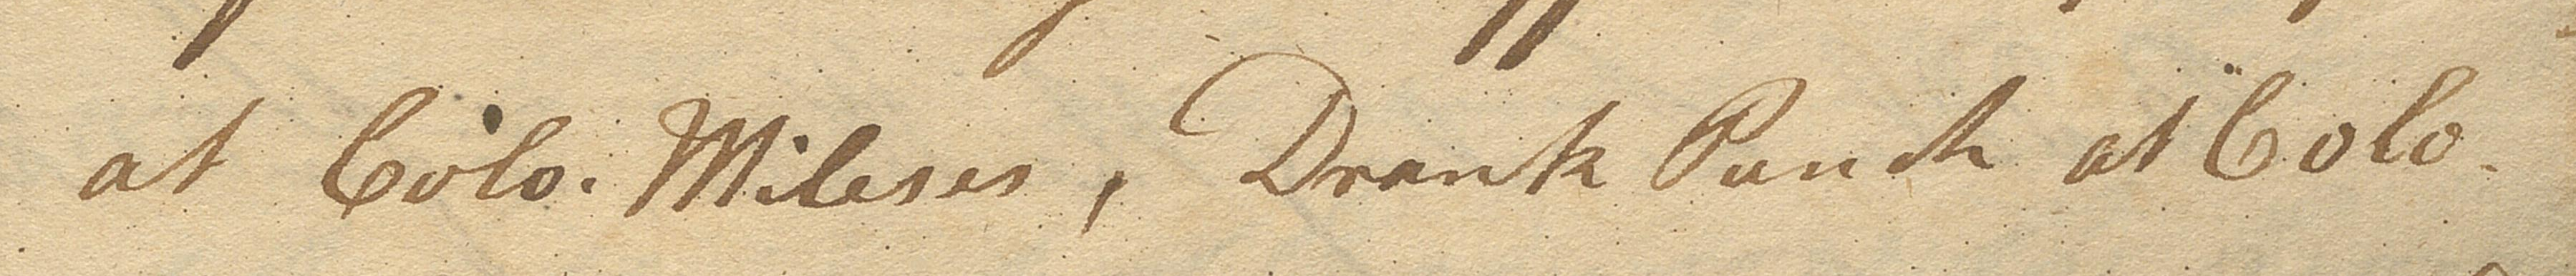at Colo. Mileses, Drank Punch at Colo.
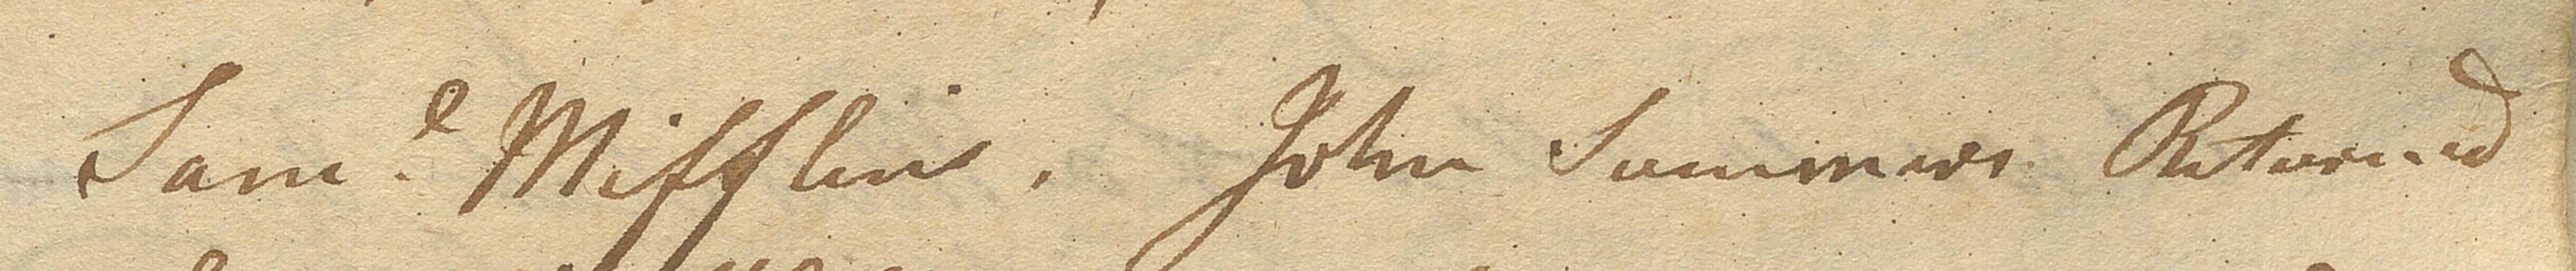Sam^l. Mifflins. John Summers Returned
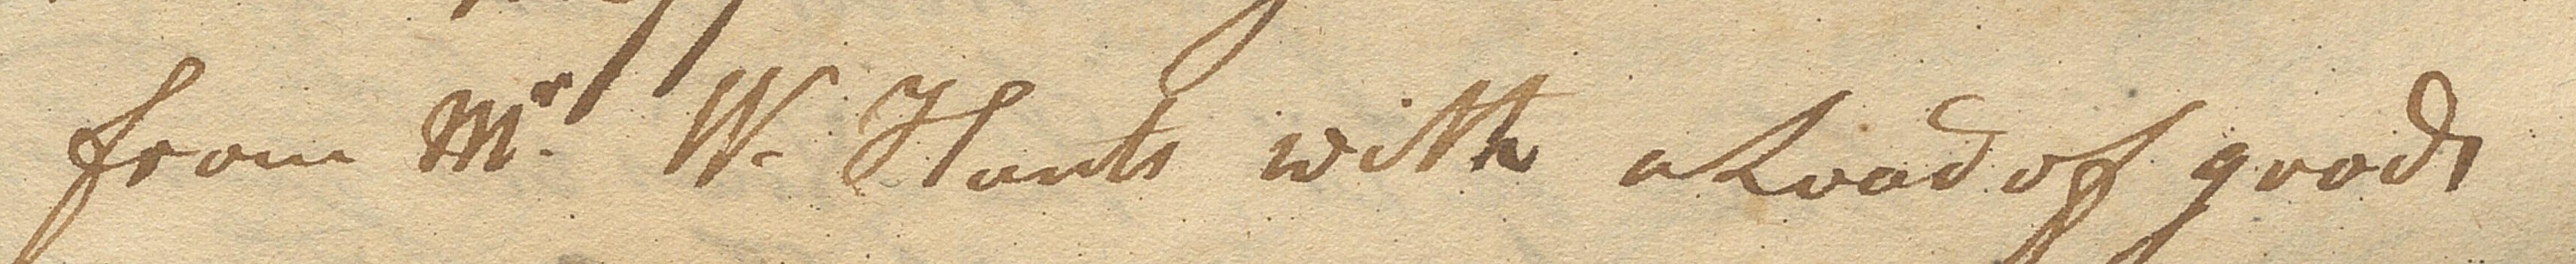from M^r. W^r. Hunts with a Load of goods
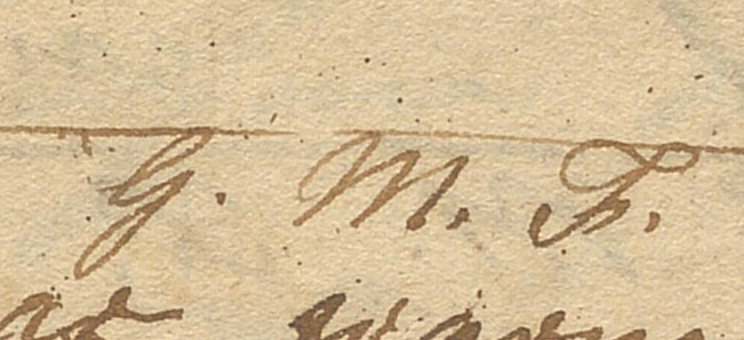G. M. F.
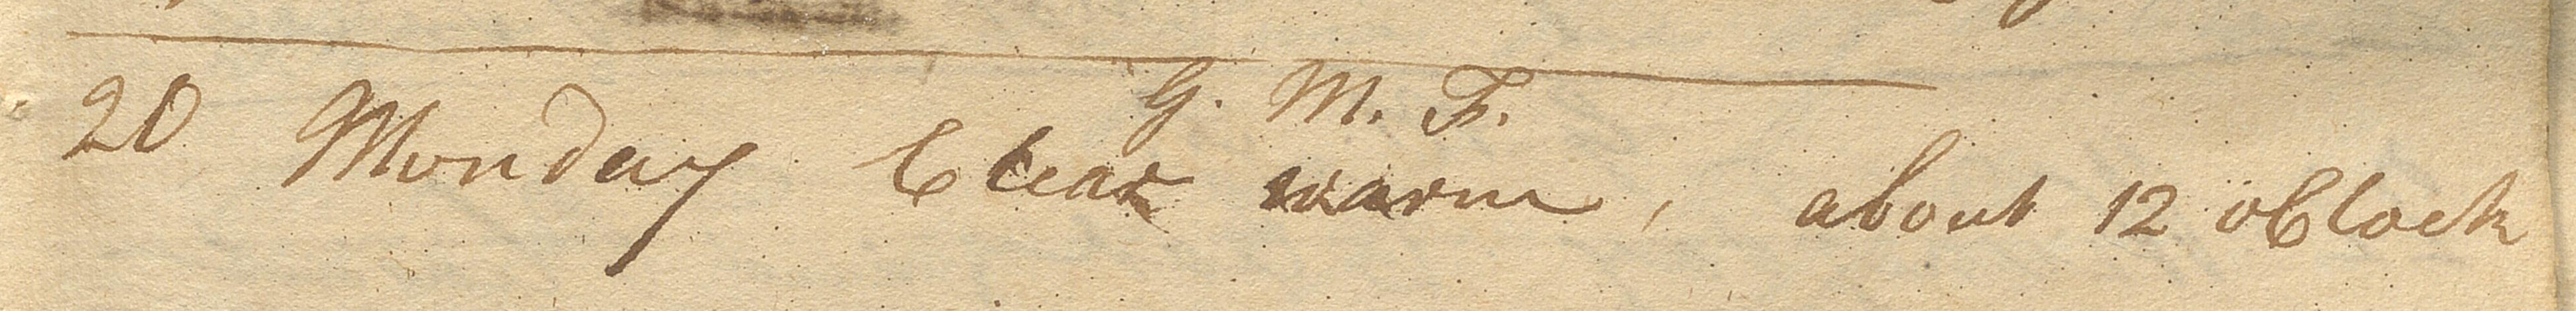20 Monday Clear warm, about 12 oClock
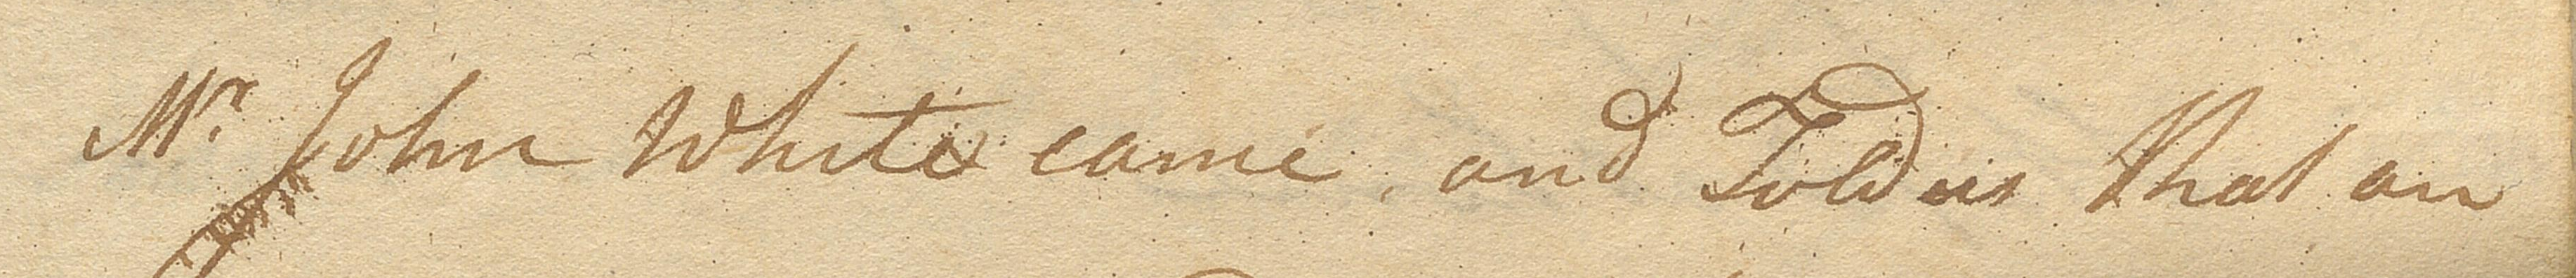M^r. John White came, and Told us that an
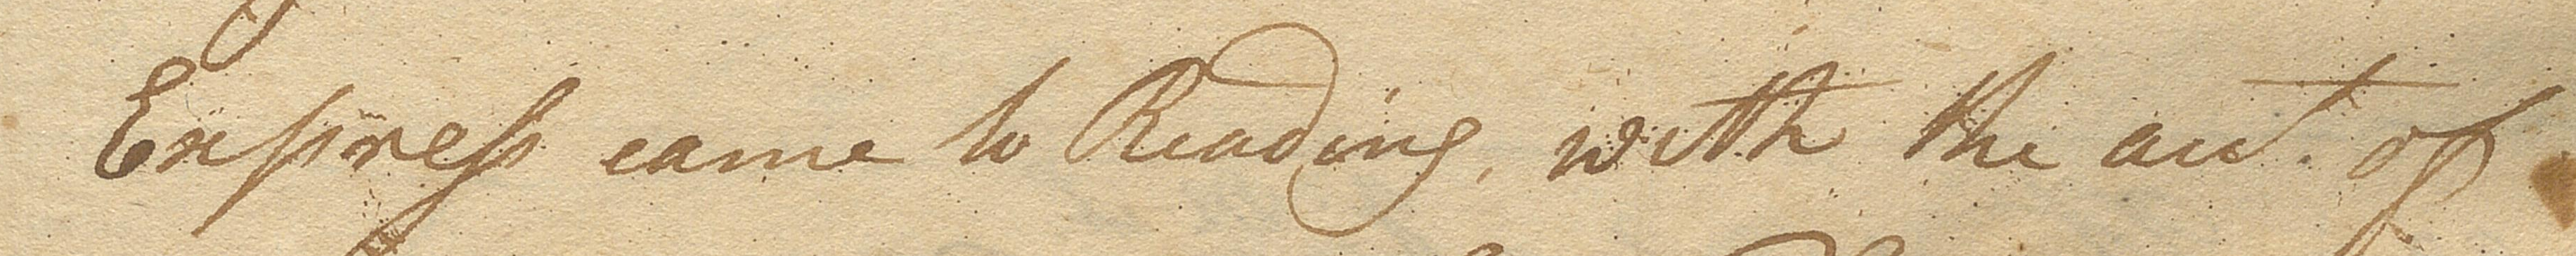Express came to Reading, with the acc^t. of
